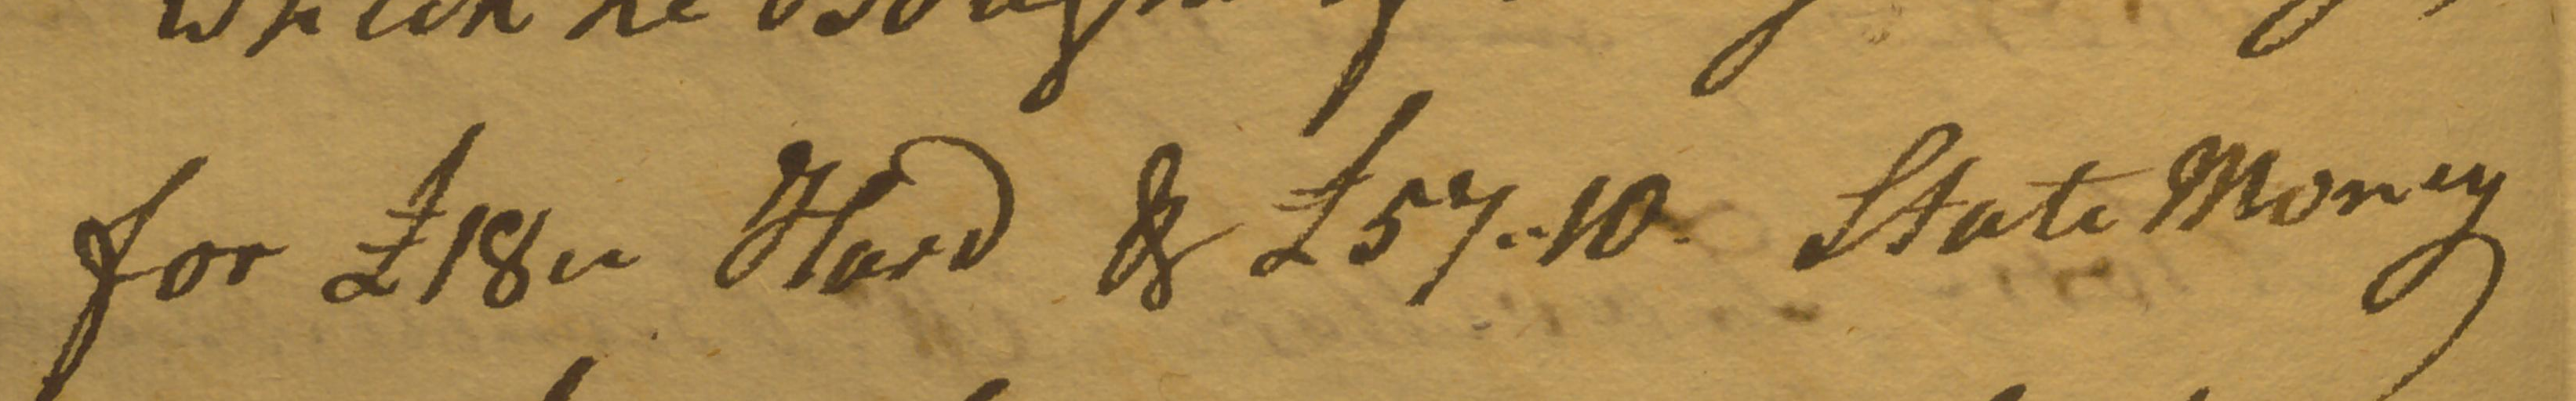for £18- Hard & £57.10. State Money
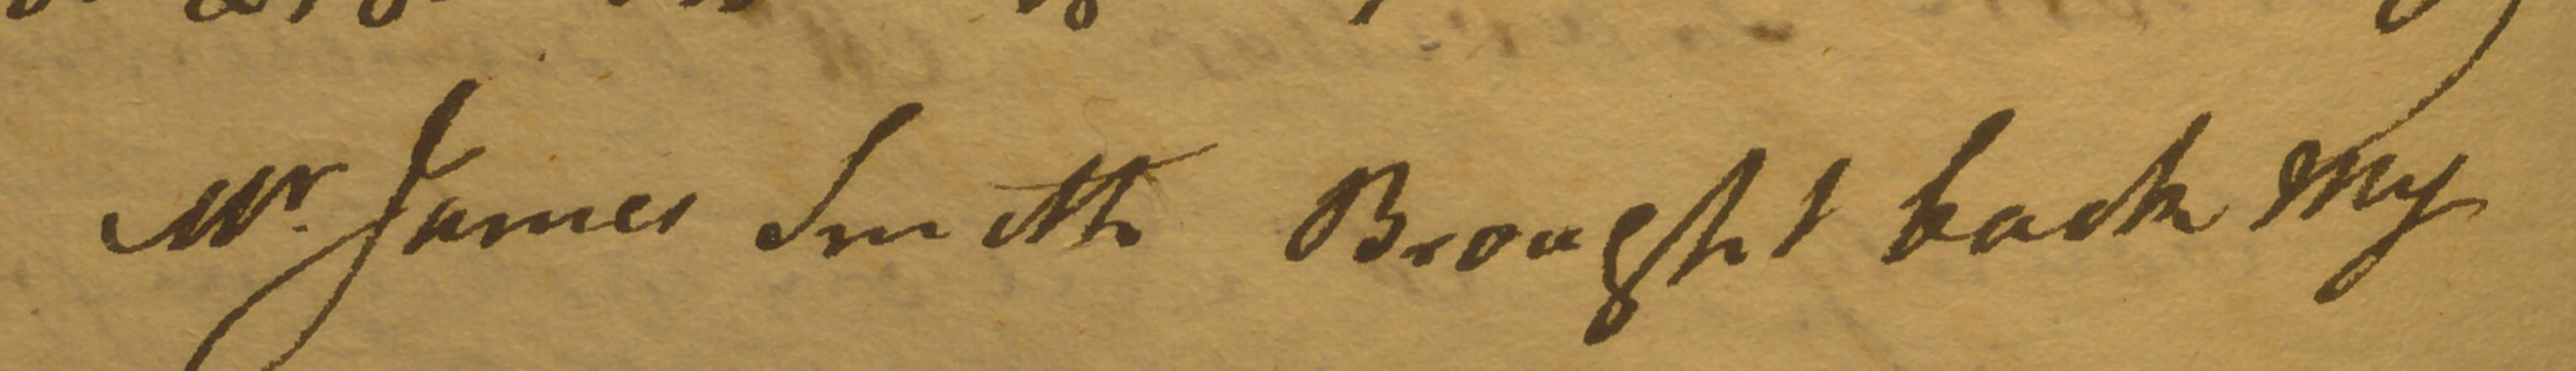M^r. James Smith Brought back My
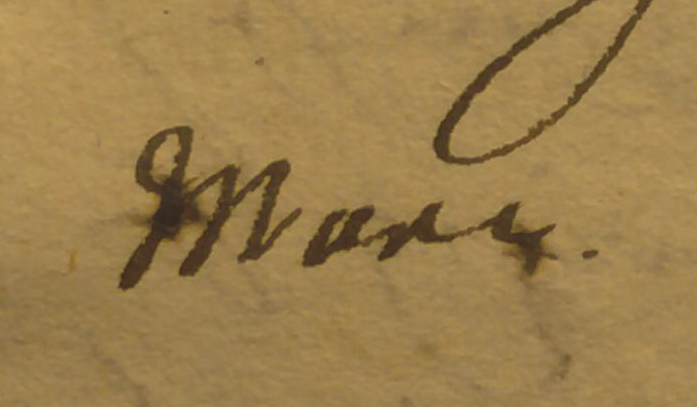Mare.
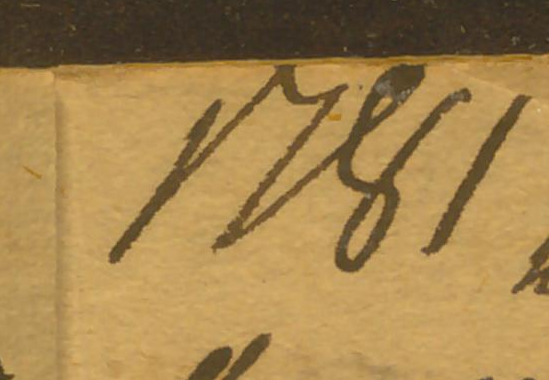1781
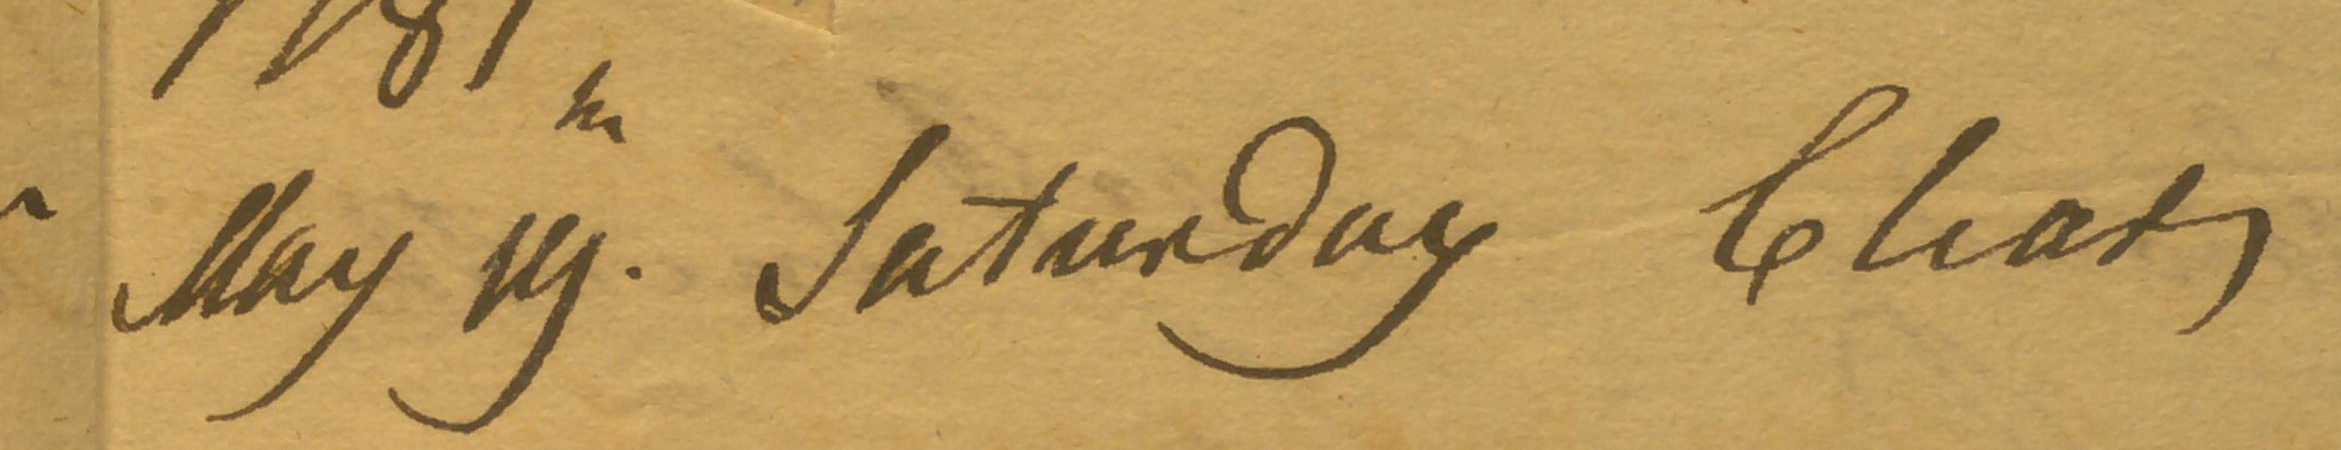May 19^th. Saturday Clear
